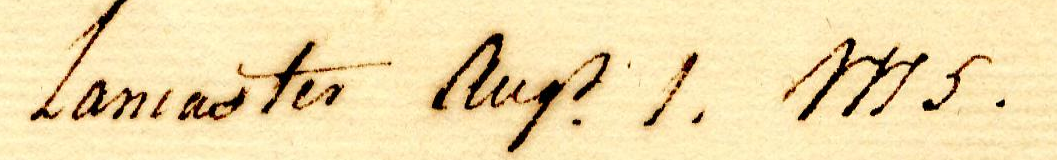Lancaster Aug^t. 1. 1775.
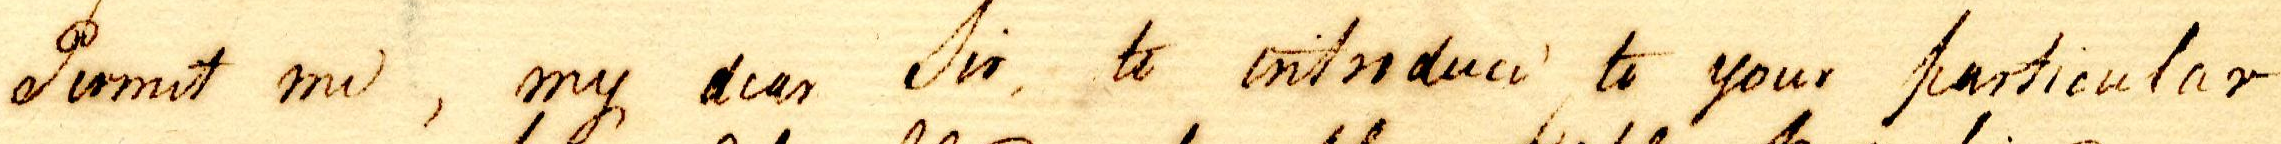Permit me, my dear Sir, to introduce, to your particular
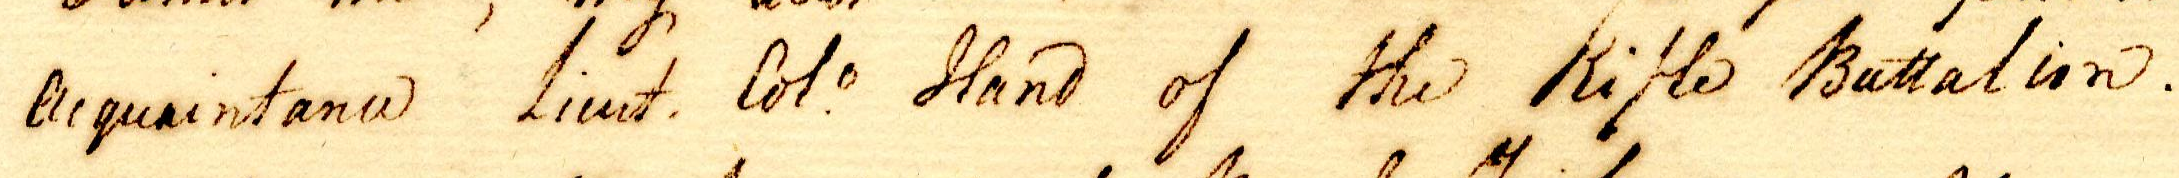Acquaintance Lieut. Col^o. Hand of the Rifle Battalion.
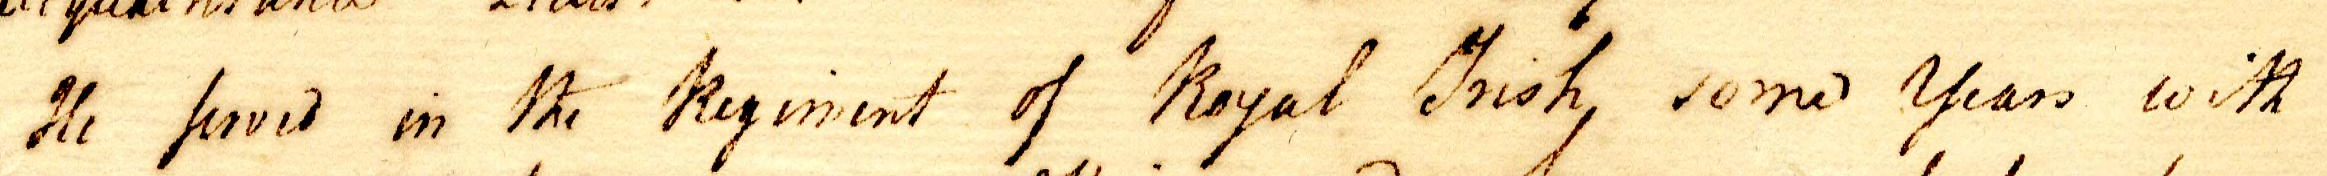He served in the Regiment of Royal Irish some Years with
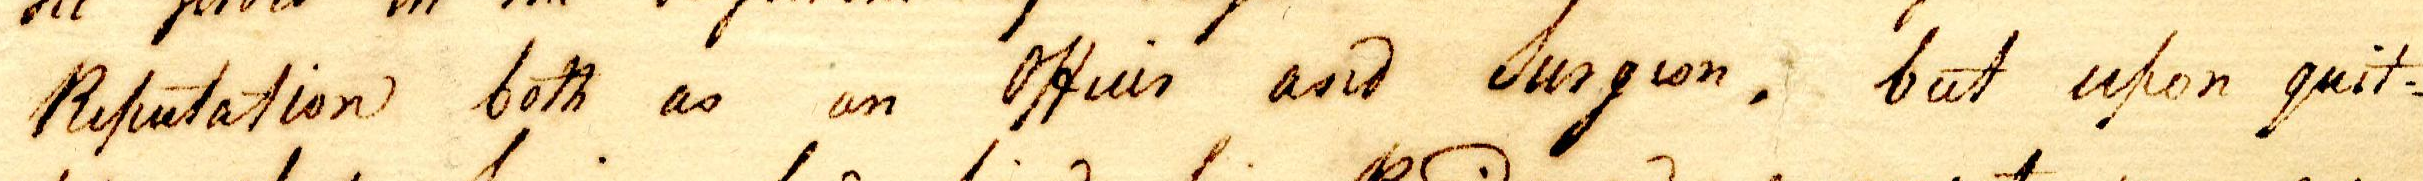Reputation both as an Officer and Surgeon, but upon quit-
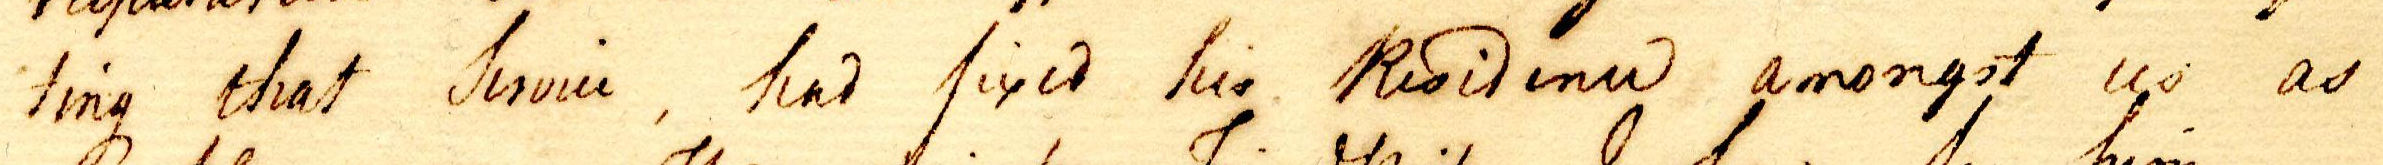-ting that Service, had fixed his Residence amongst us as
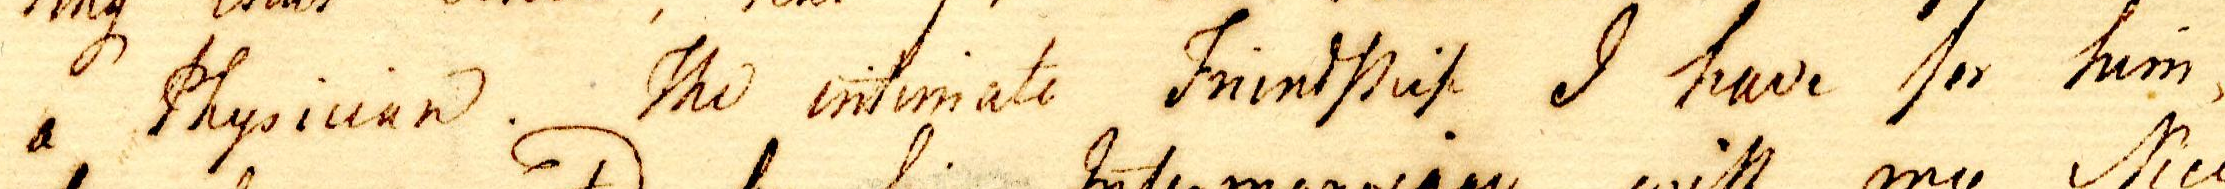a Physician. The intimate Friendship I have for him
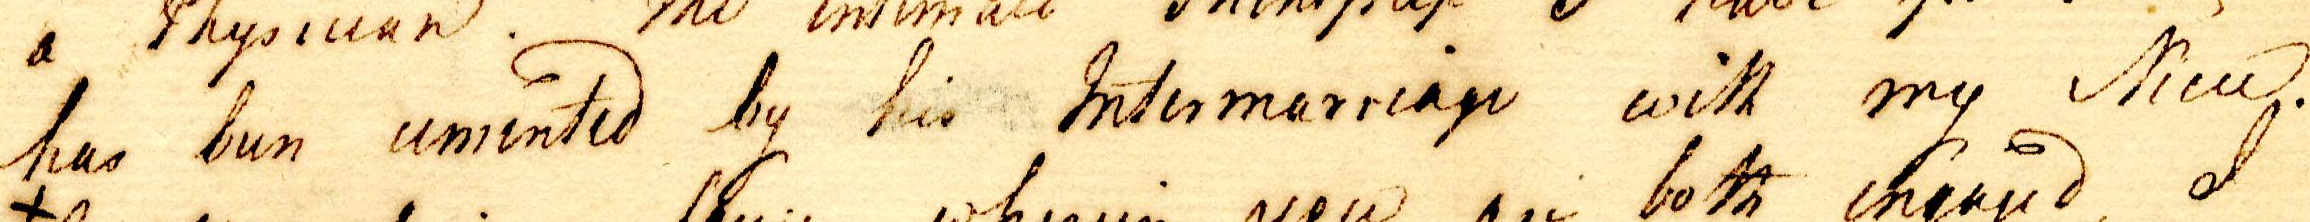has been cemented by his Intermarriage with my Niece.
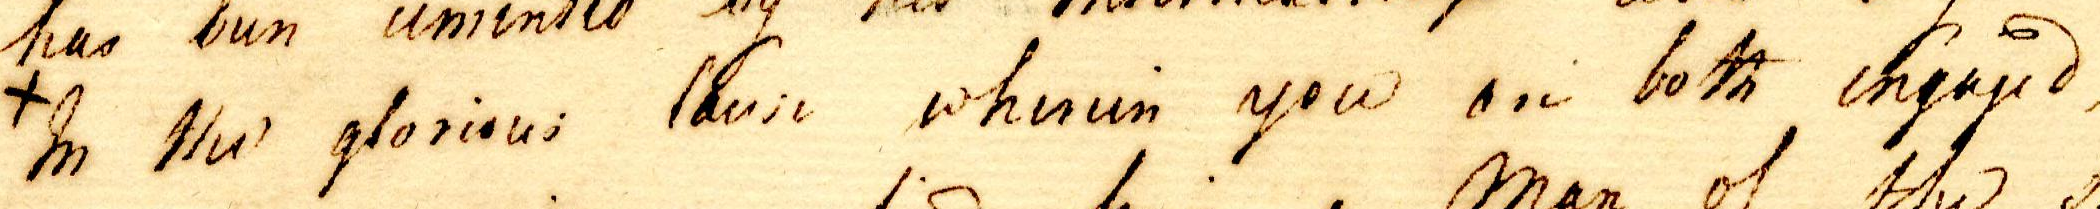In the glorious Cause wherien you are both engaged, I
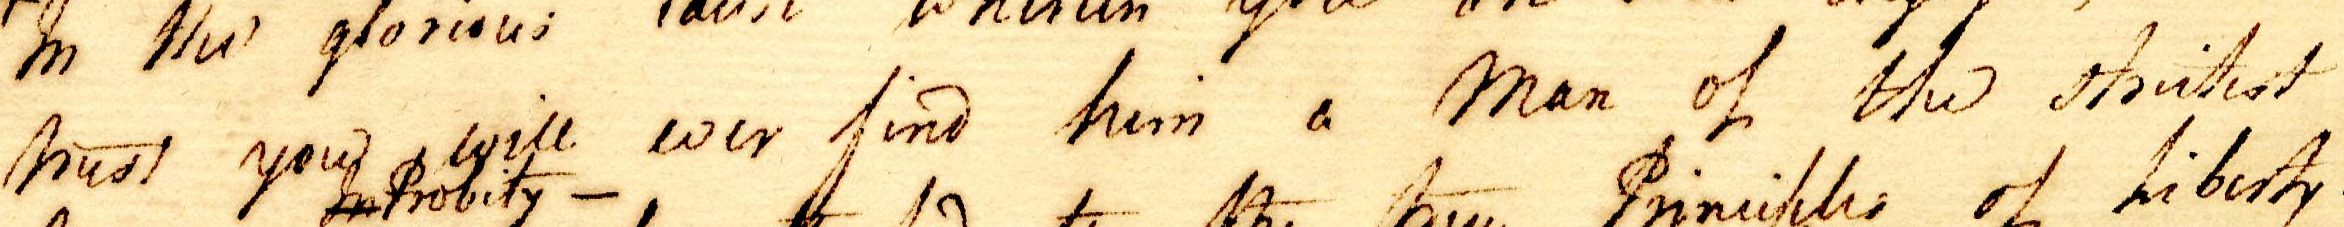trust you will ever find him a man of the strictest
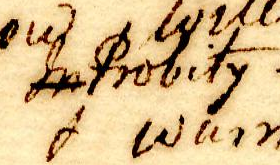In Probity
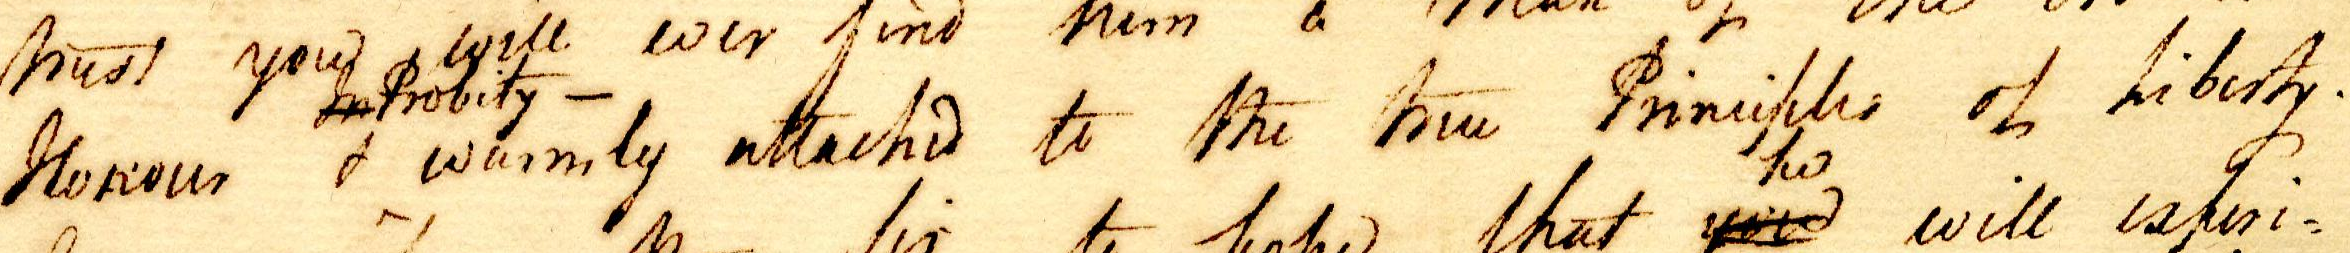Honour & ^ warmly attached to the true Principles of Liberty
